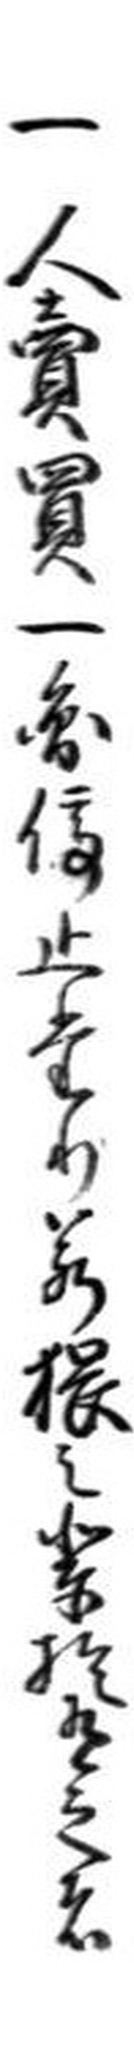一人売買一円停止たり若猥之輩於有之者
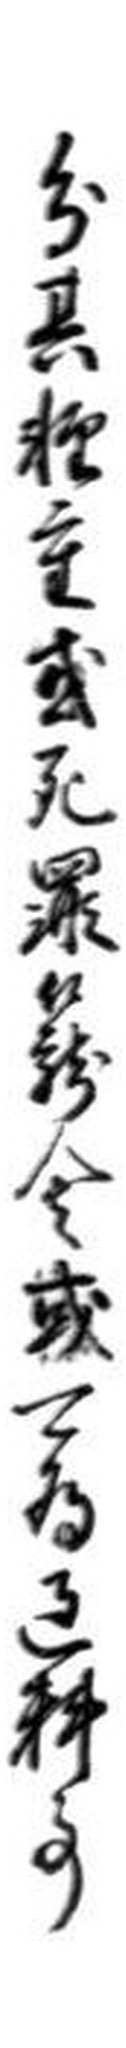分其軽重或死罪籠舎或可為過料事
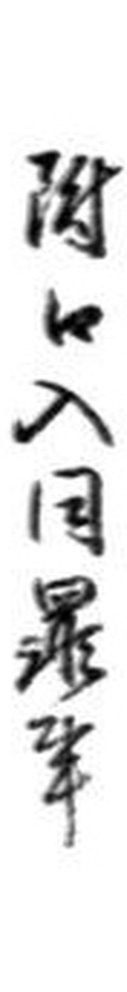附口入同罪事
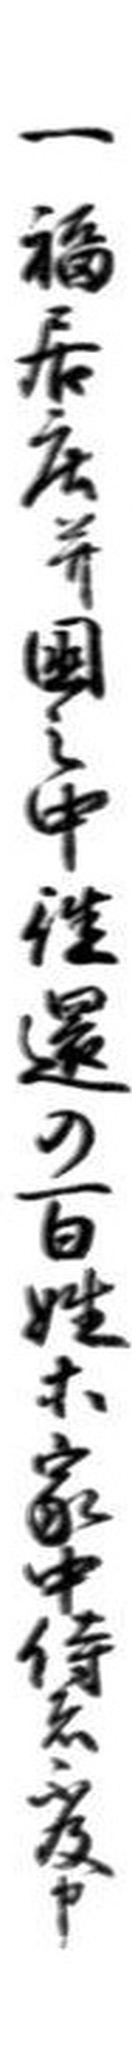一福居庄幷国之中往還之百姓等家中侍者不及申
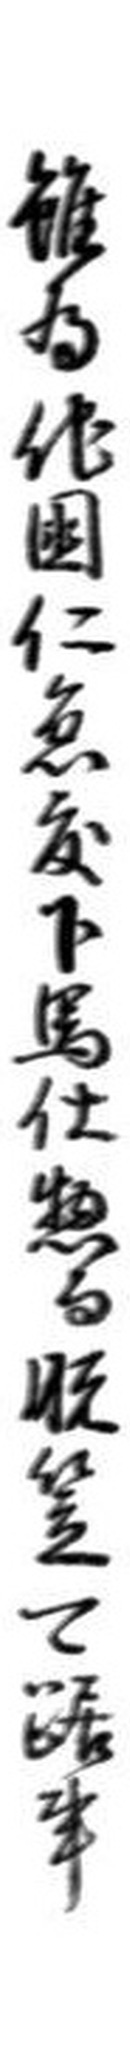雖為他国仁急度下馬仕惣而脱笠可踞事
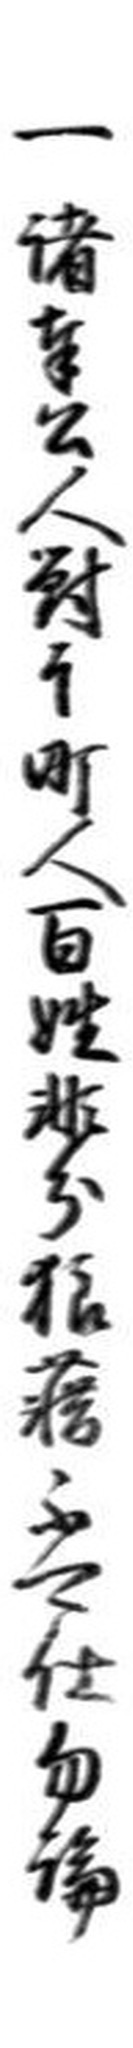一諸奉公人対于町人百姓非分狼藉不可仕勿論
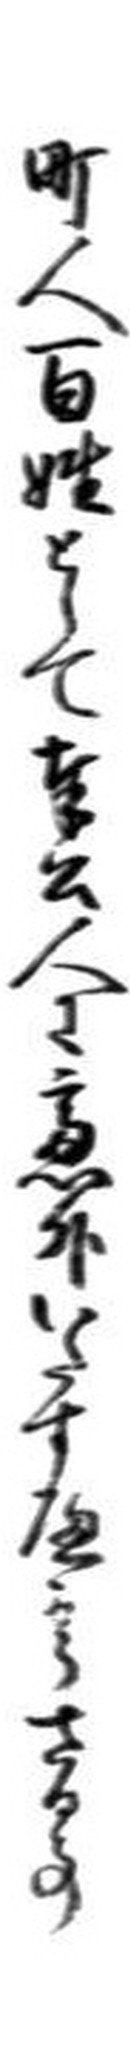町人百姓として奉公人に慮外いたすへからさる事
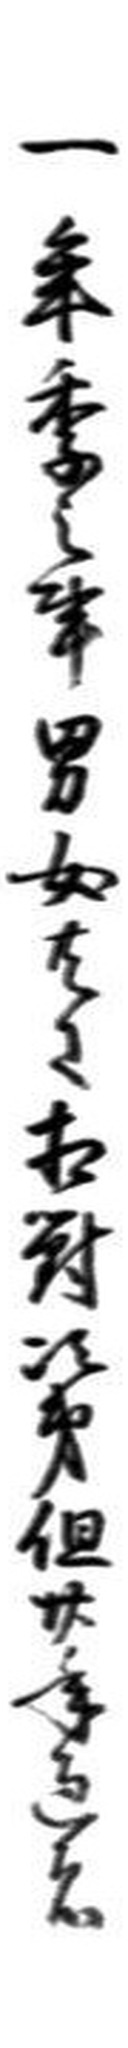一年季之事男女共に相対次第但廿年過者
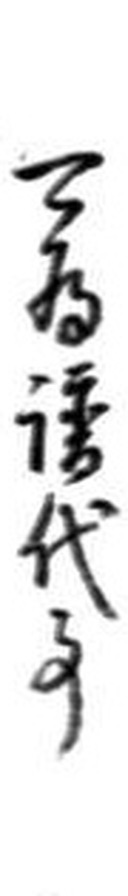可為譜代事
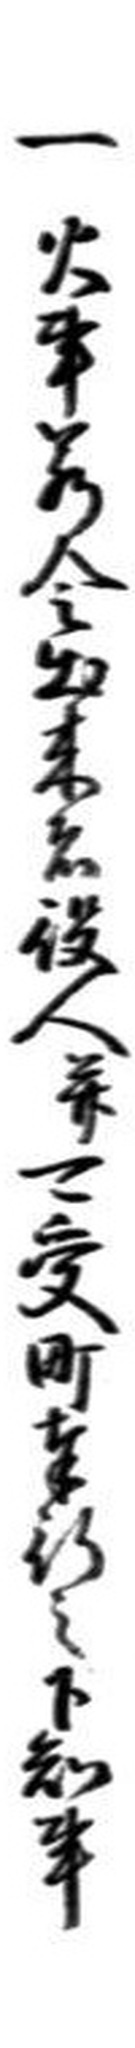一火事若令出来者役人并可受町奉行之下知事

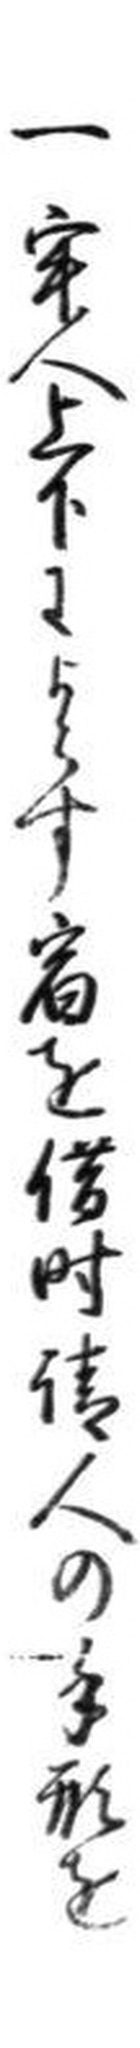一牢人上下によらす宿を借時請人の手形を
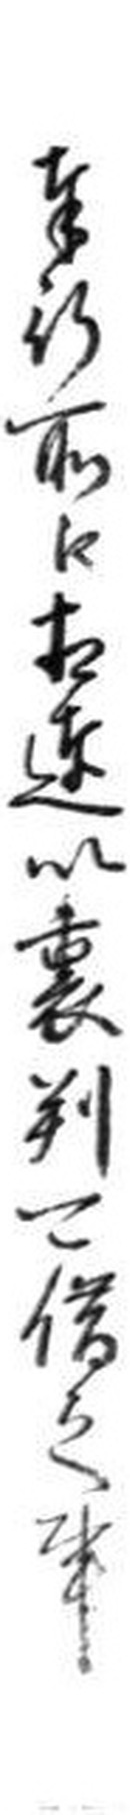奉行所江相達以裏判可借之事
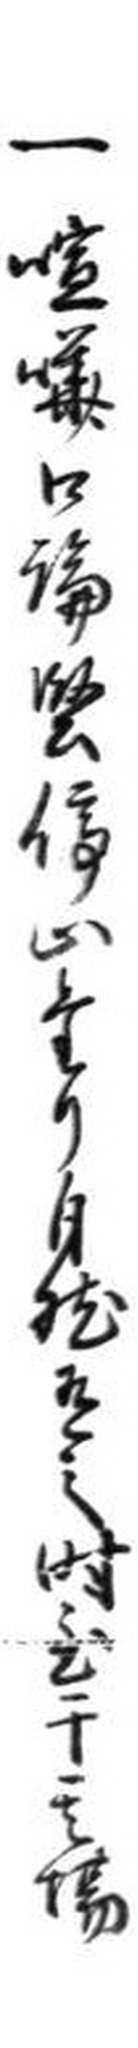一喧嘩口論堅停止たり自然有之時至于其場
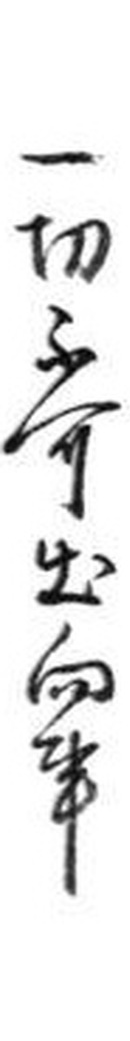一切不可出向事
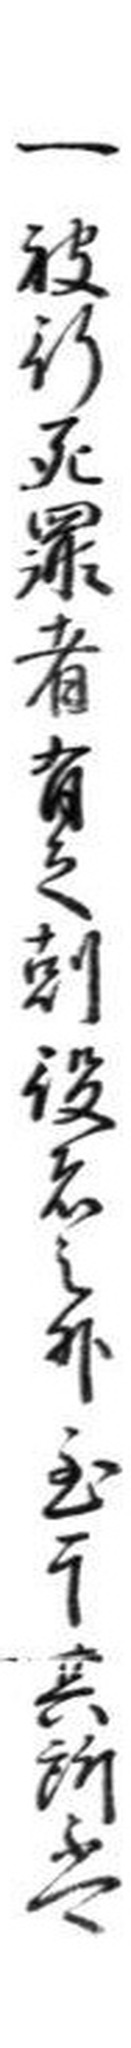一被行死罪者有之刻役者之外至于其所不可
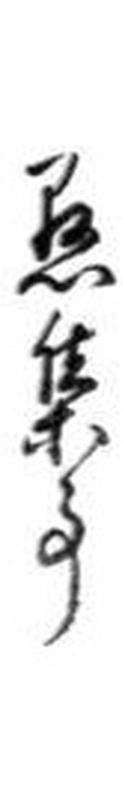懸集事
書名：家譜 七 光通公 従寛文四年到同九年
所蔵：福井県文書館 Fukui Prefectural Archives
